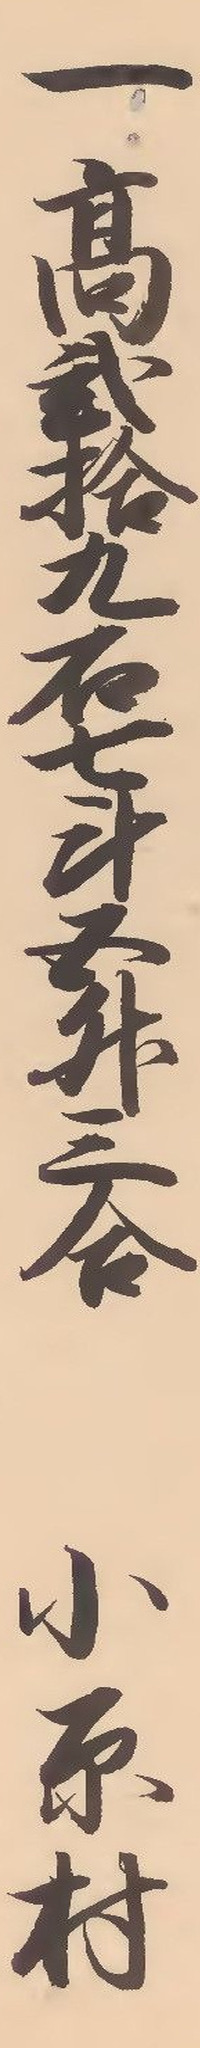一高弐拾九石七斗五升三合小原村
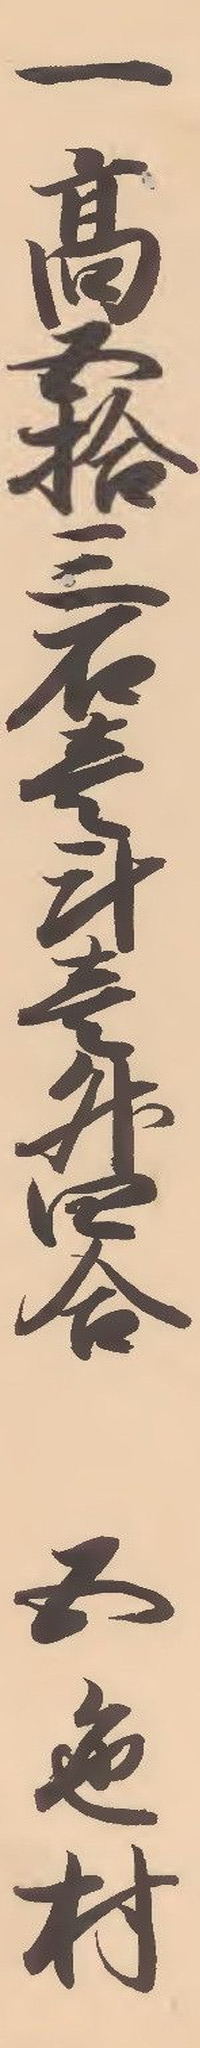一高五拾三石壱斗壱升四合五色村
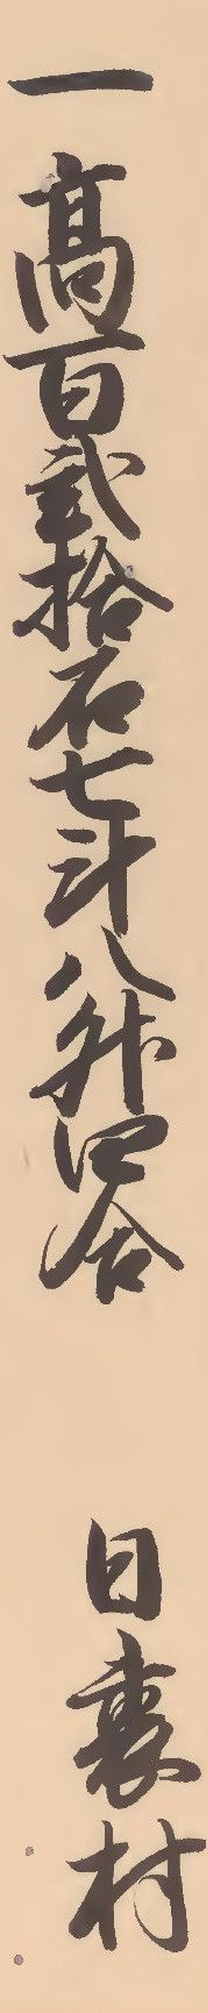一高百弐拾石七斗八升四合日裏村
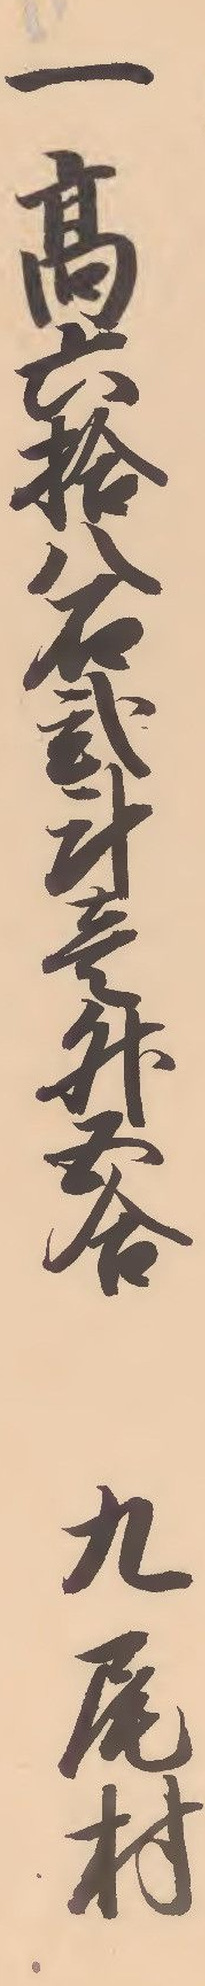一高六拾八石弐斗壱升五合九尾村
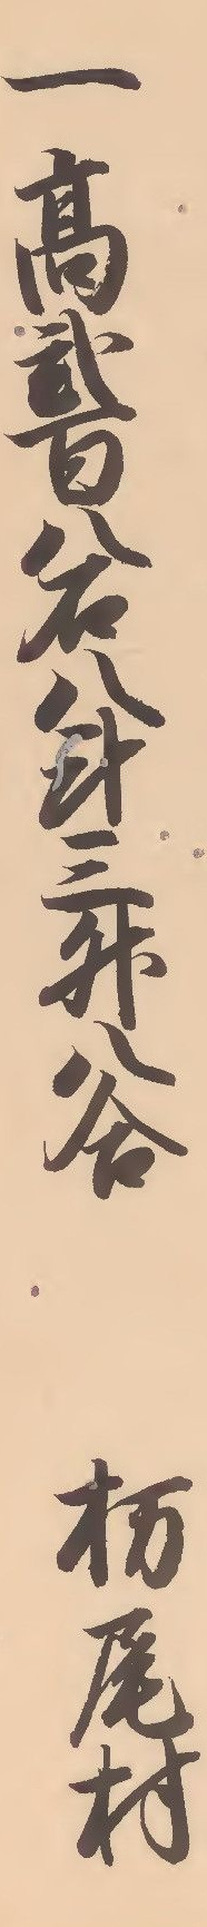一高弐百八石八斗三升八合栃尾村

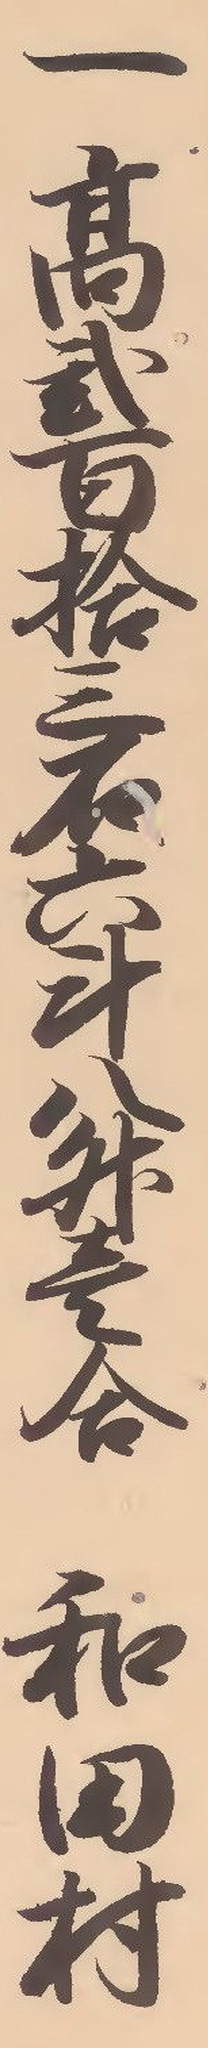一高弐百拾三石六斗八升壱合和田村
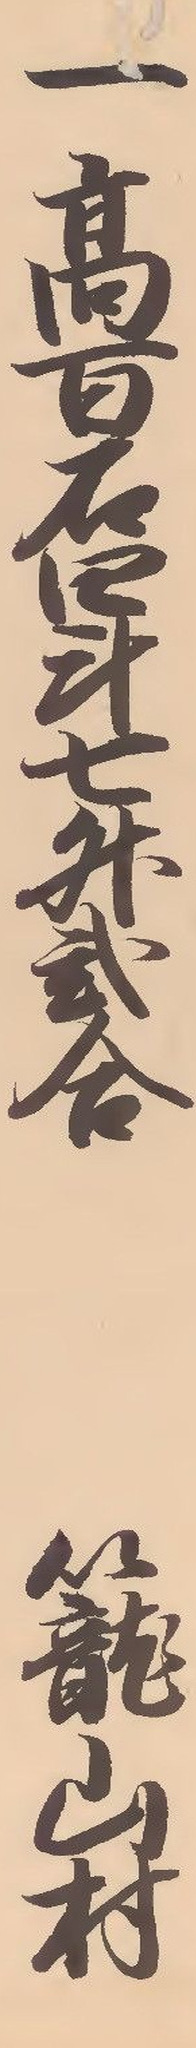一高百石四斗七升弐合篭山村
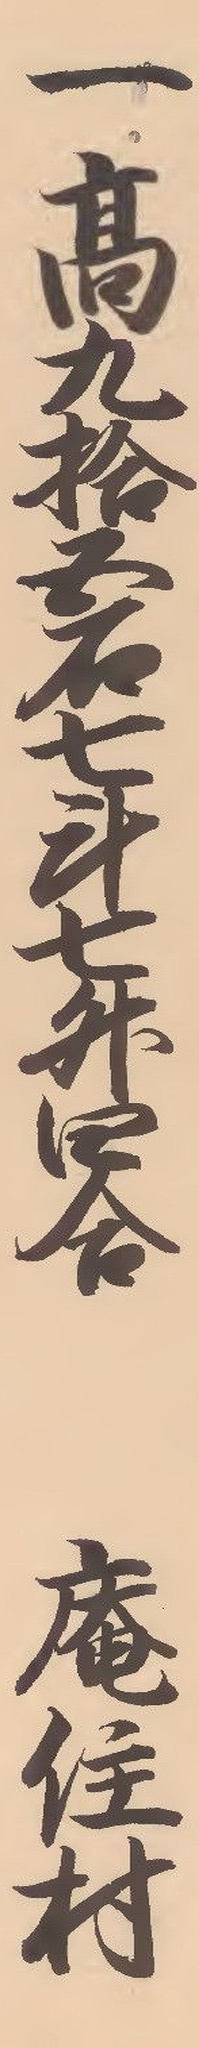一高九拾五石七斗七升四合庵住村
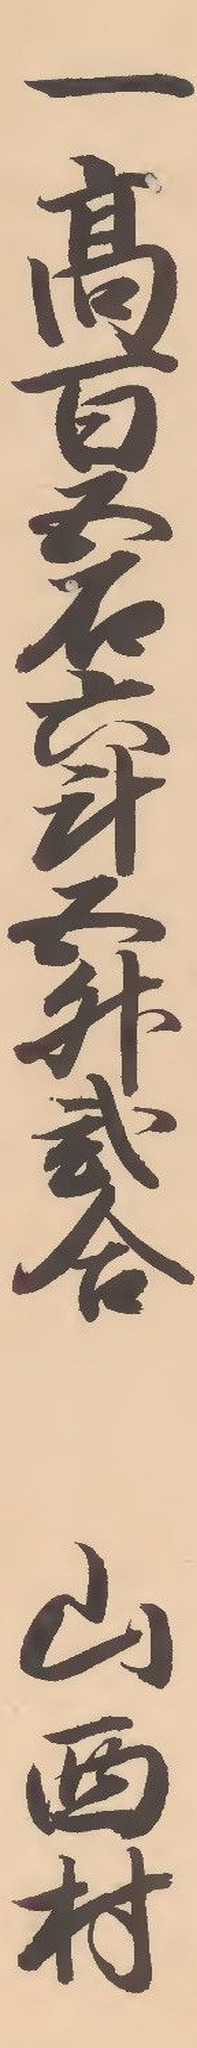一高百五石六斗五升弐合山西村
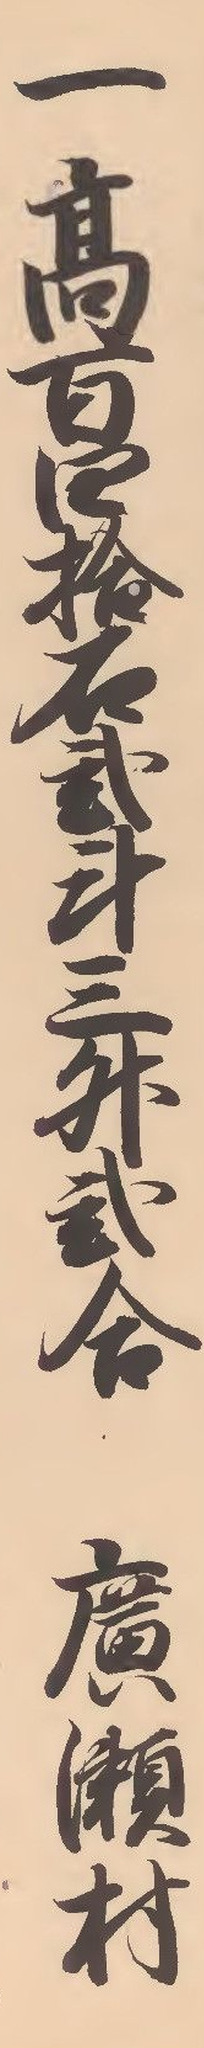一高百四拾石弐斗三升弐合広瀬村
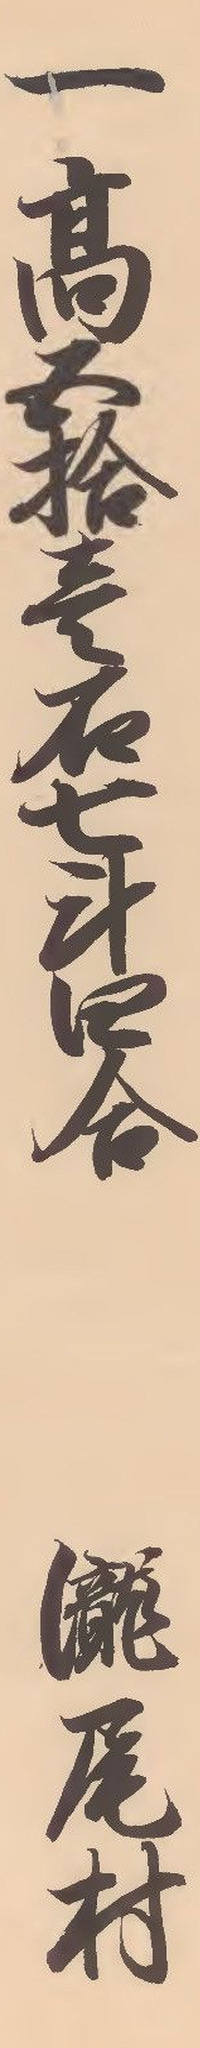一高五拾壱石七斗四合滝尾村
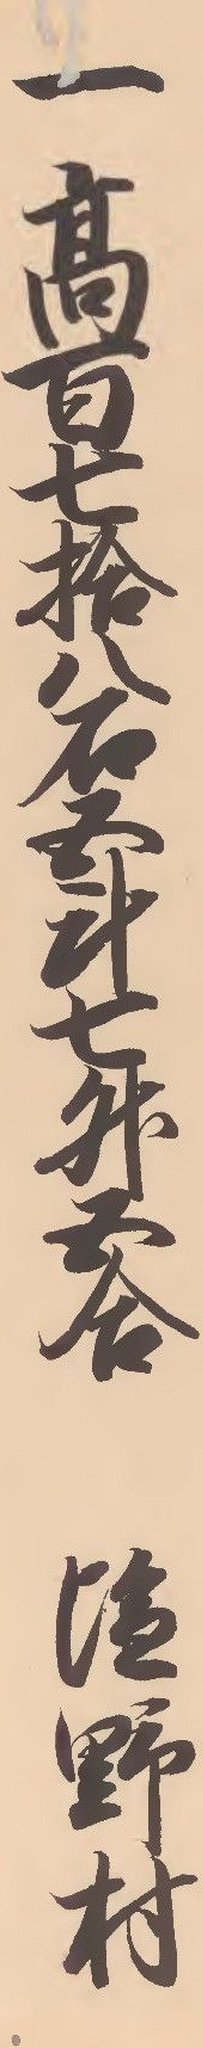一高百七拾八石五斗七升五合塩野村
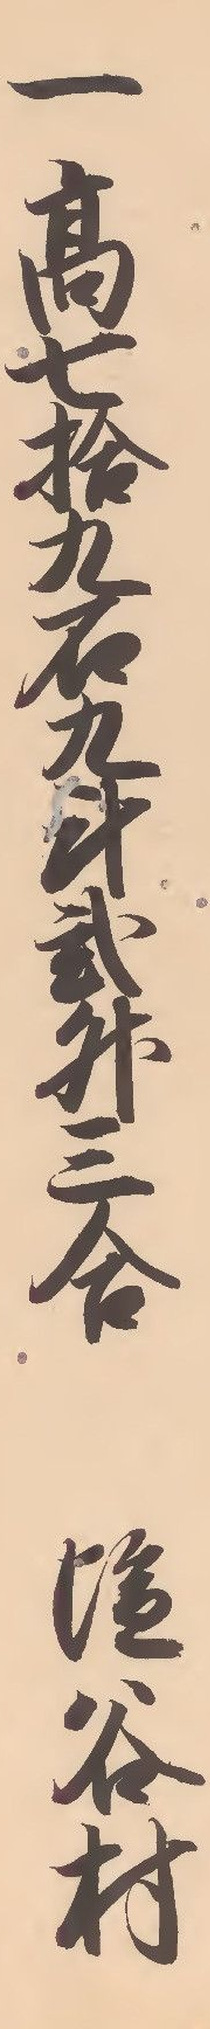一高七拾九石九斗弐升三合塩谷村

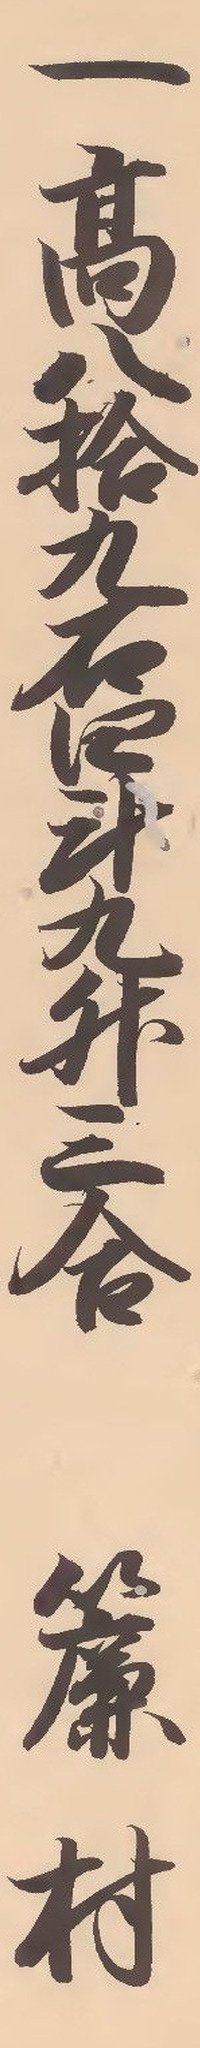一高八拾九石四斗九升三合簾村
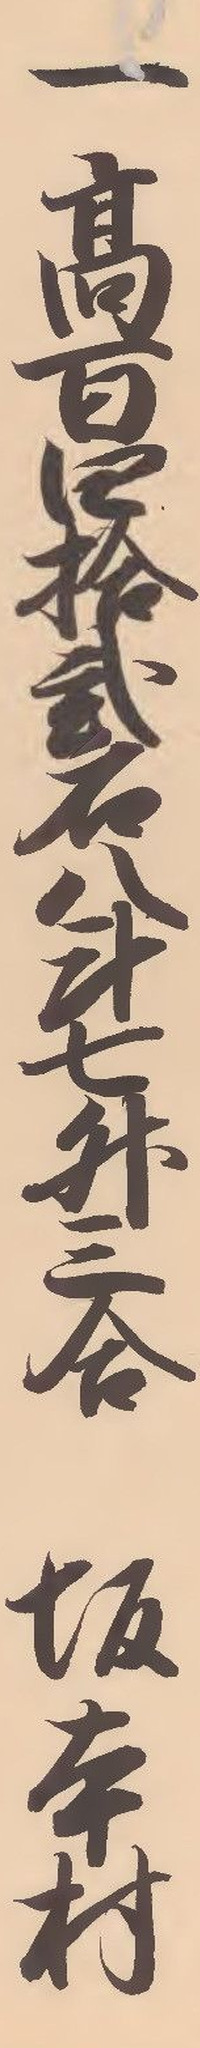一高百四拾弐石八斗七升三合坂本村
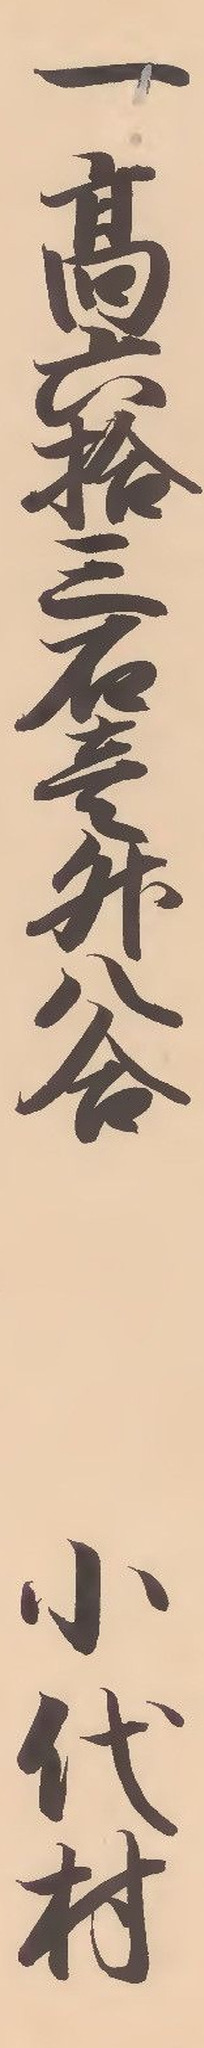一高六拾三石壱升八合小代村
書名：大和国郷帳
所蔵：国立公文書館 National Archives of Japan
